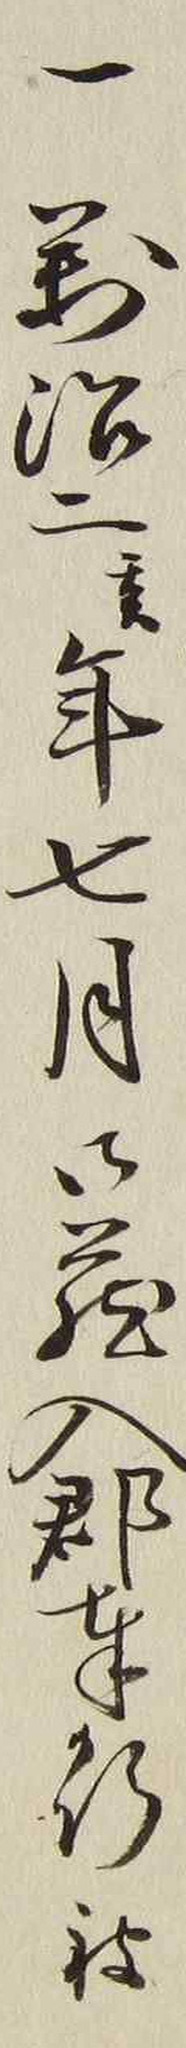一万治二亥年七月御蔵入郡奉行被
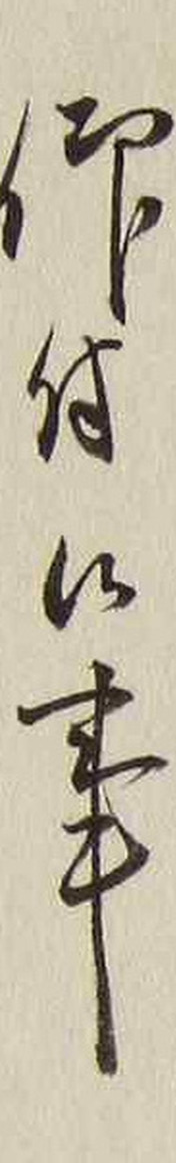仰付候事
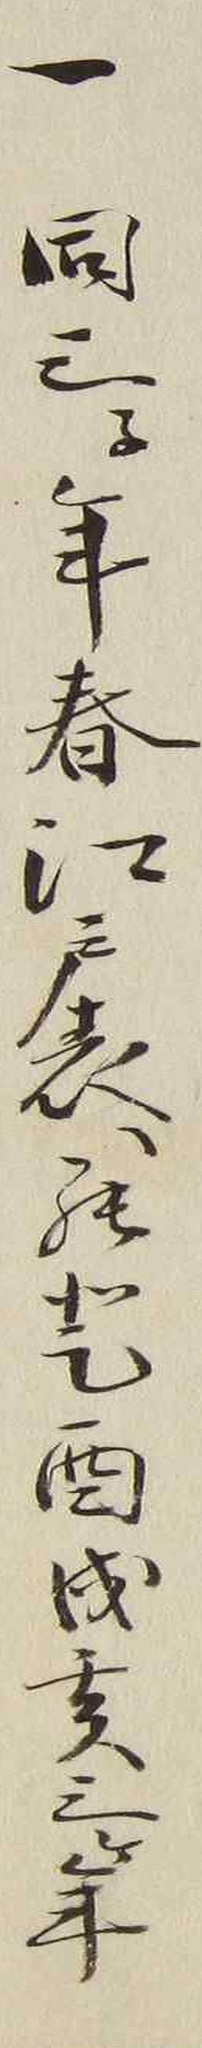一同三子年春江戸表ㇸ罷登酉戌亥三ヶ年

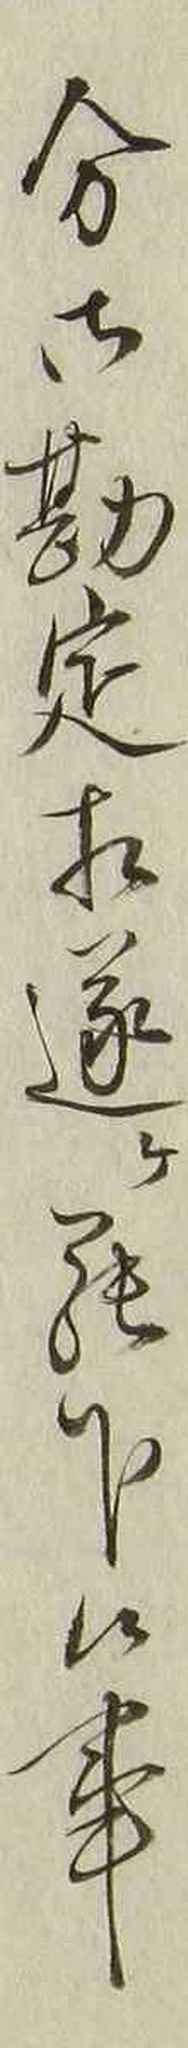分御勘定相遂ヶ罷下候事
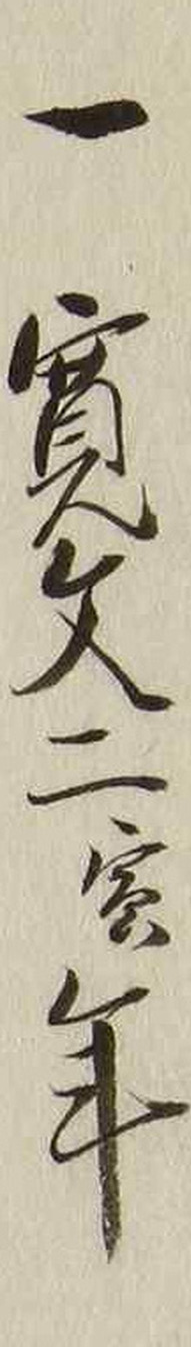一寛文二寅年
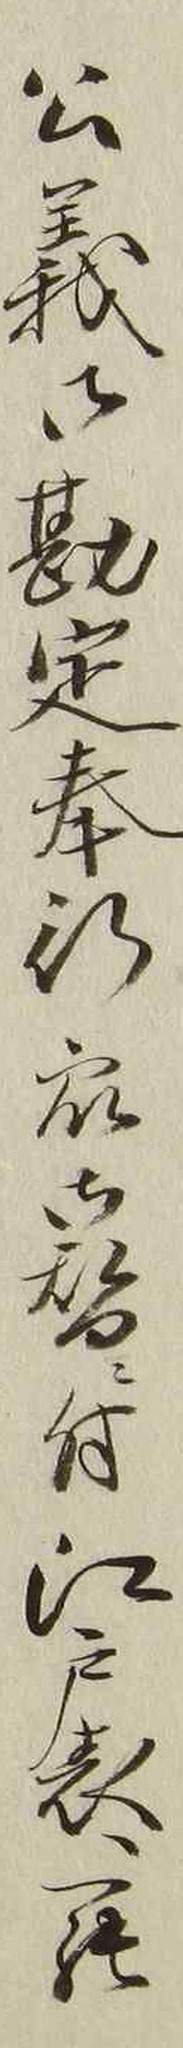公儀御勘定奉行衆御替ニ付江戸表ㇸ罷
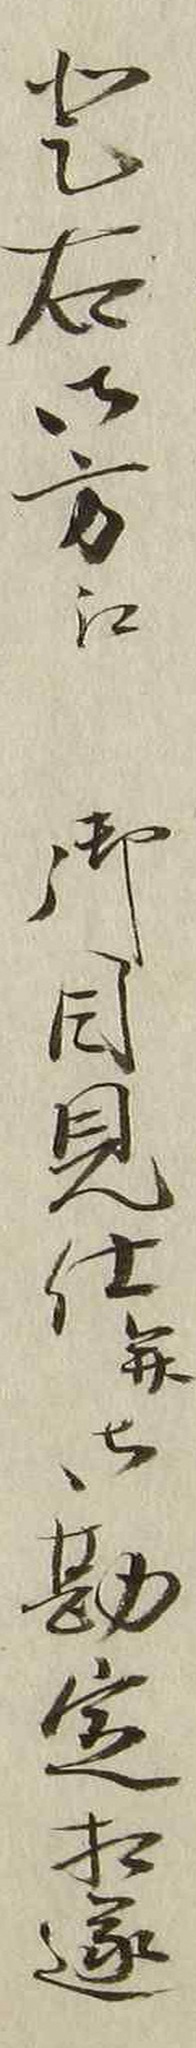登右御方え御目見仕幷御勘定相遂
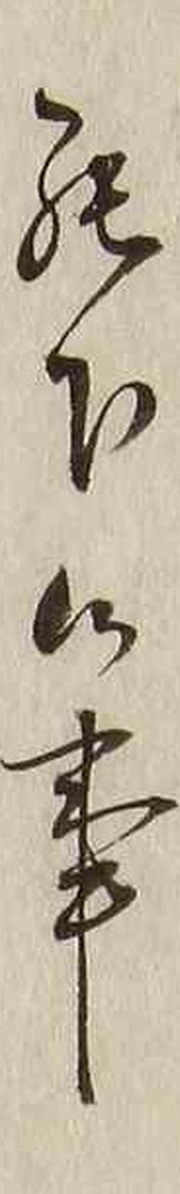罷下候事
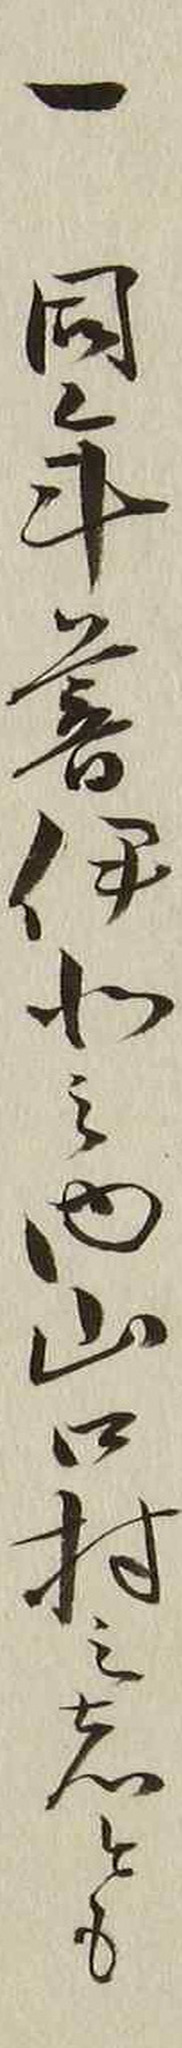一同年暮伊北之内山口村之者とも
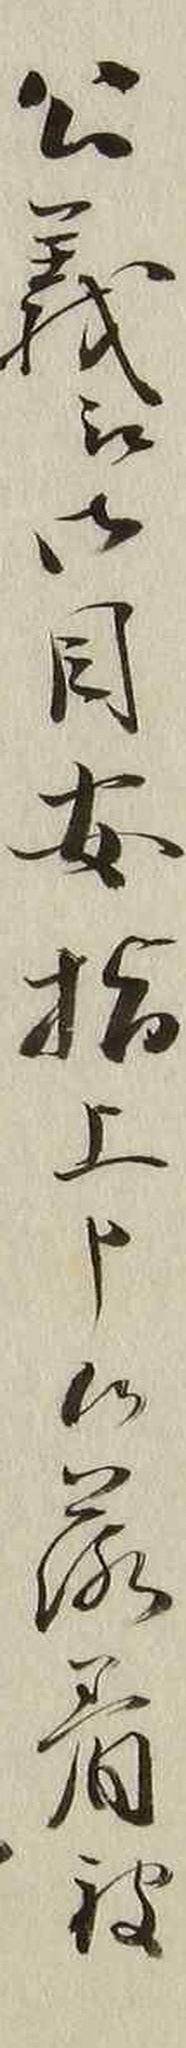公儀え御目安指上申御落着被
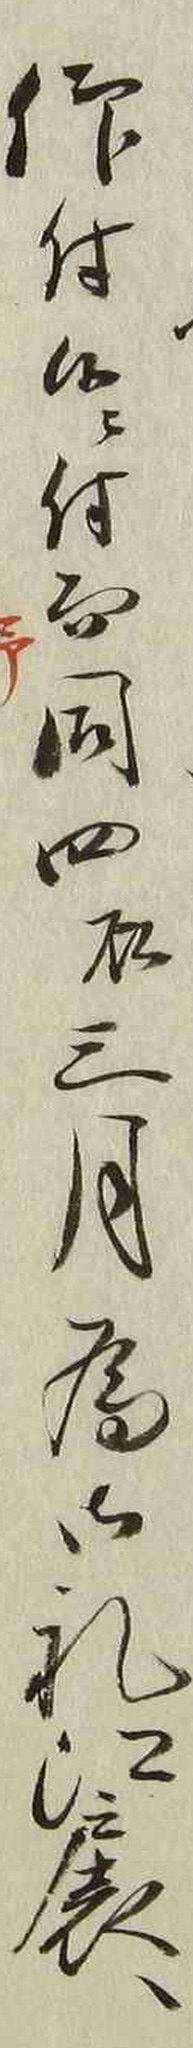仰付候ニ付而同四辰三月為御礼江戸表ㇸ
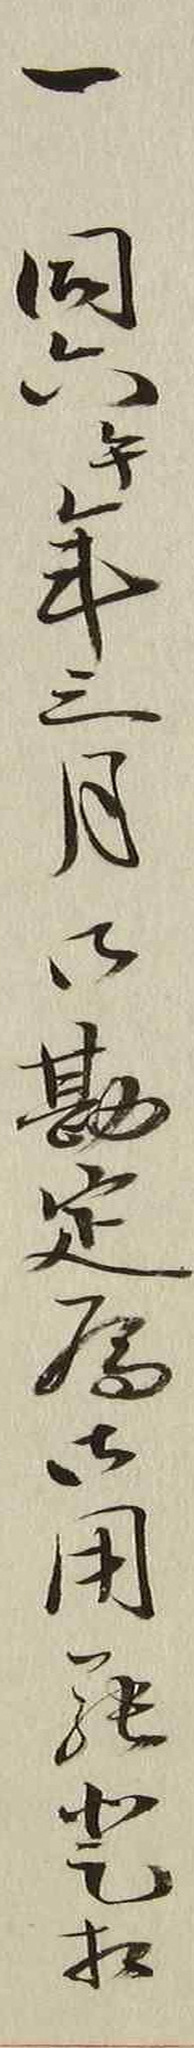一同六午年三月御勘定為御用罷登相
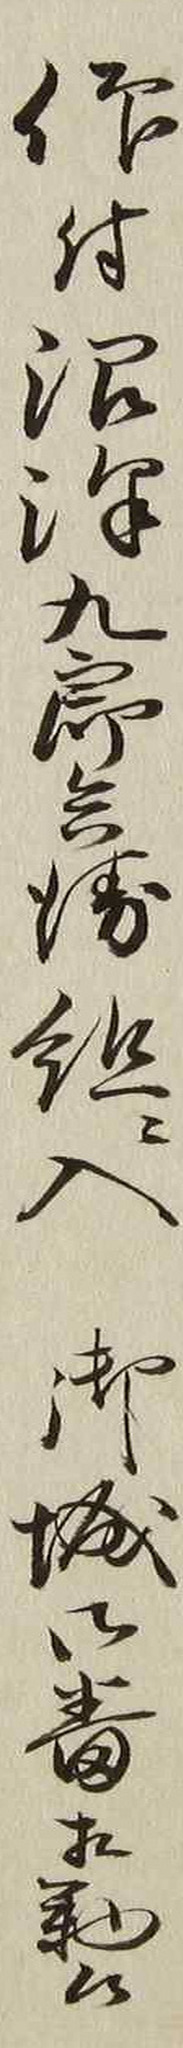仰付沼沢九郎兵衛組ニ入御城御番相勤候
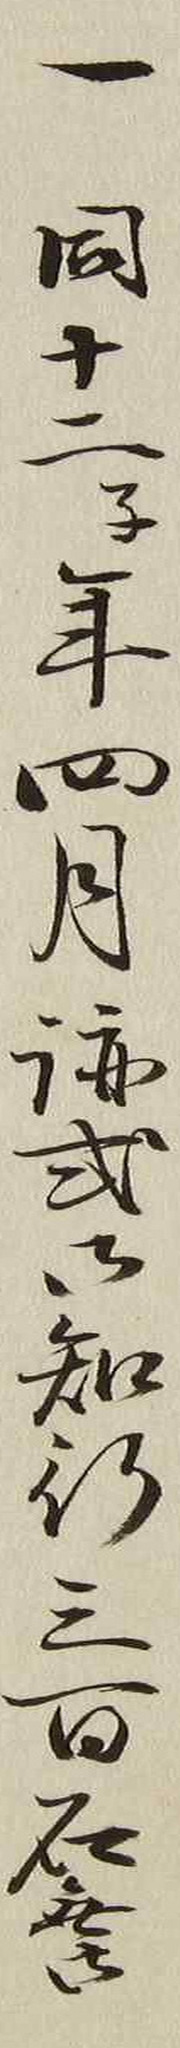一同十二子年四月跡式御知行三百石無御
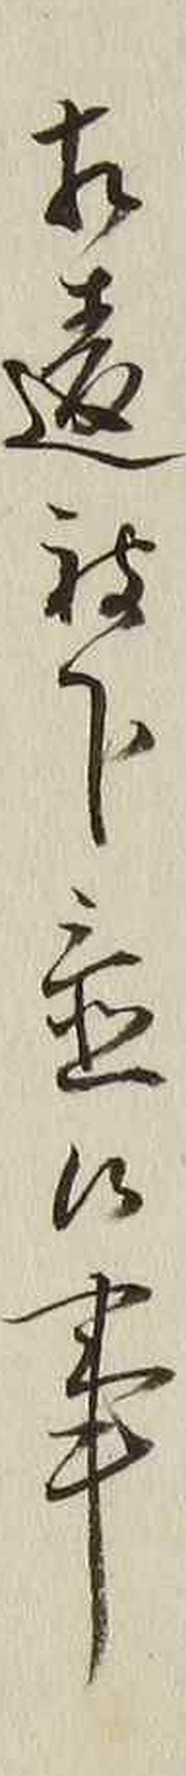相違被下置候事
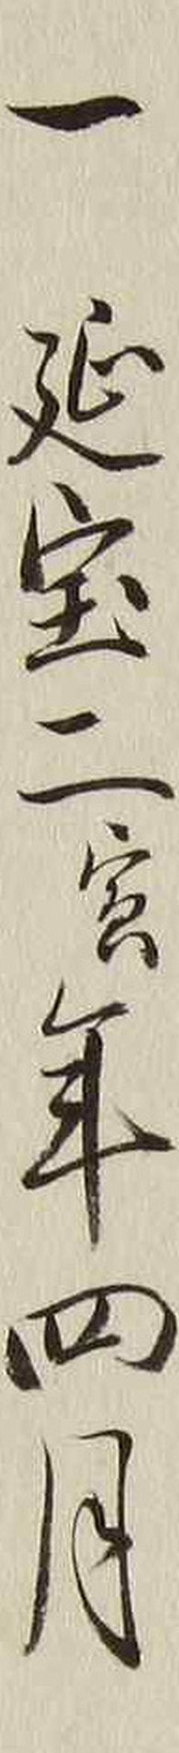一延宝二寅年四月
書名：諸士系譜　巻之163　な之部5
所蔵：会津若松市立会津図書館
